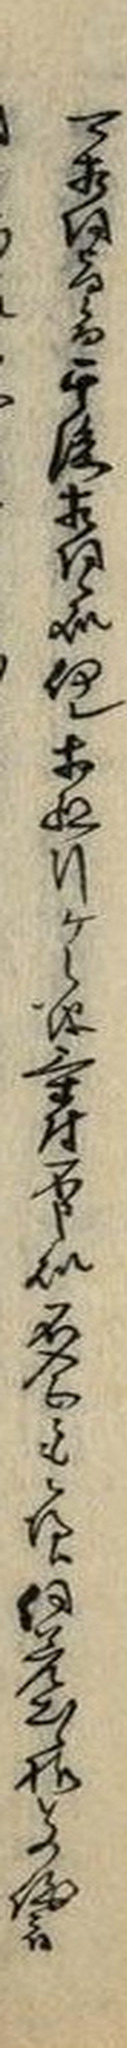可相伺旨にて其後相伺候処何レ前組引ケ之儀気付不申処不念にも候得は伺差出候様との儀に付
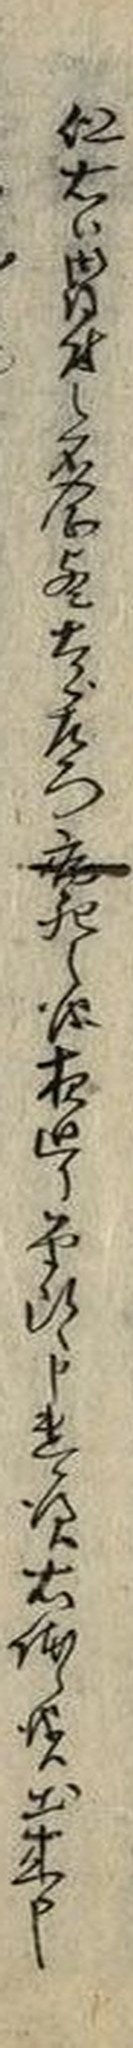但右は御目付之不念歟太郎左衛門病死之儀夜廻り筆頭へ申遣候得は右体之儀は出来申
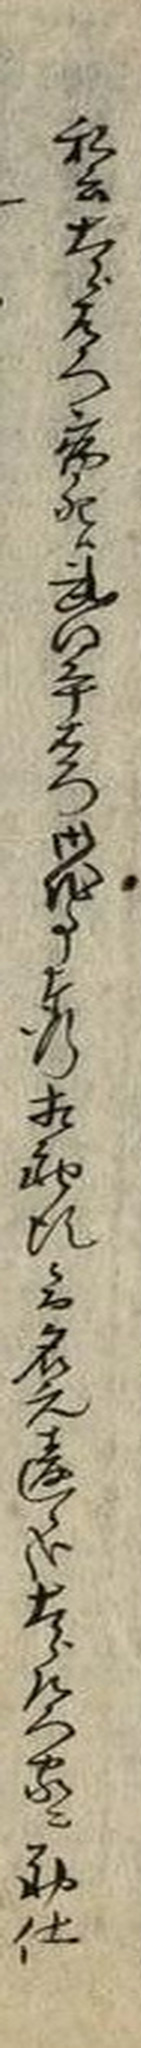私言太郎左衛門病死は武田平右衛門御作事奉行相勤頃にて名元違候哉太郎左衛門家に勤仕
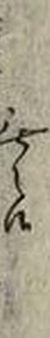無之候
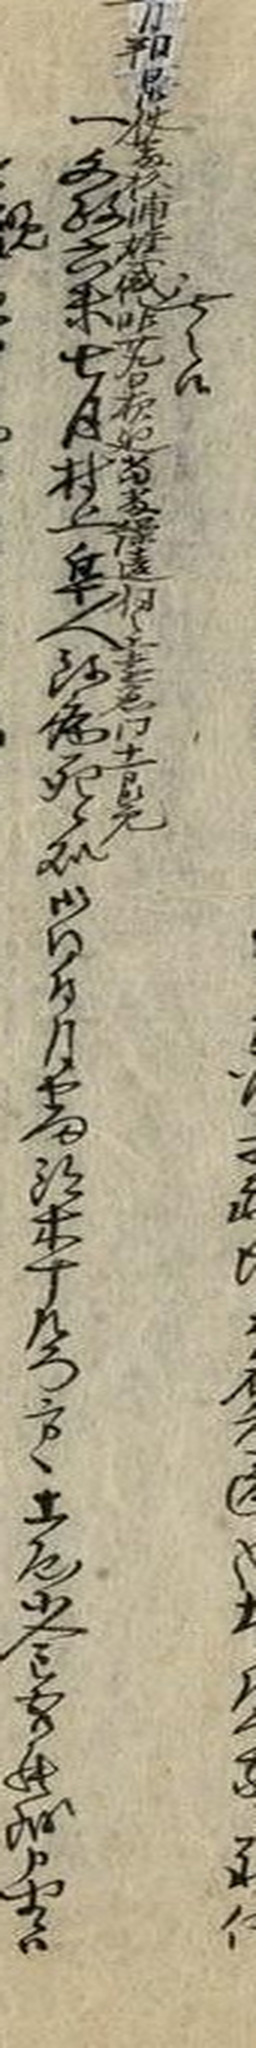一文政六未七月村上隼人致病死候処御目付月番鈴木十左衛門方へ土屋小金吾罷越申聞候は
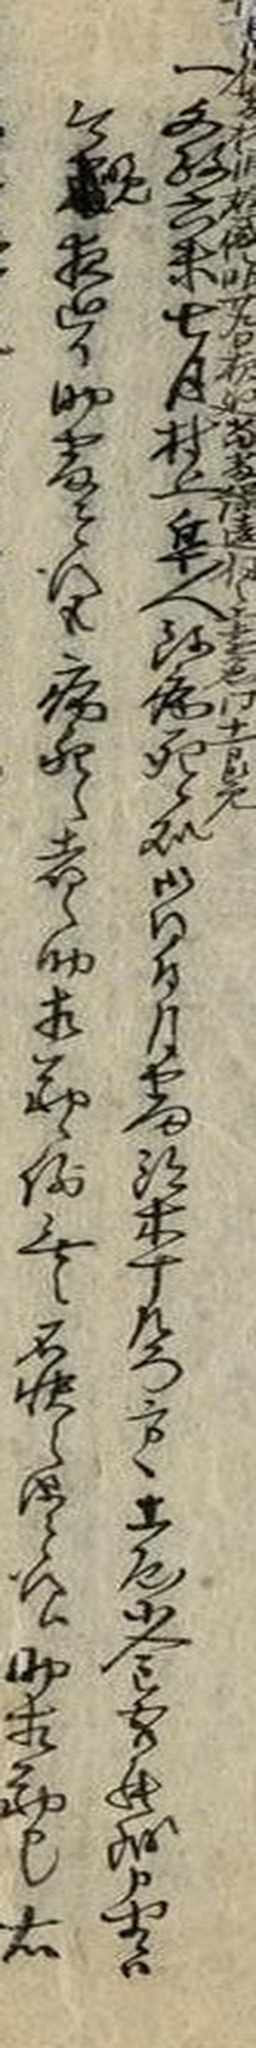今晩夜廻り助番に候得共病死之者之助相勤候儀無之不快之儀に候得は助相勤申候右
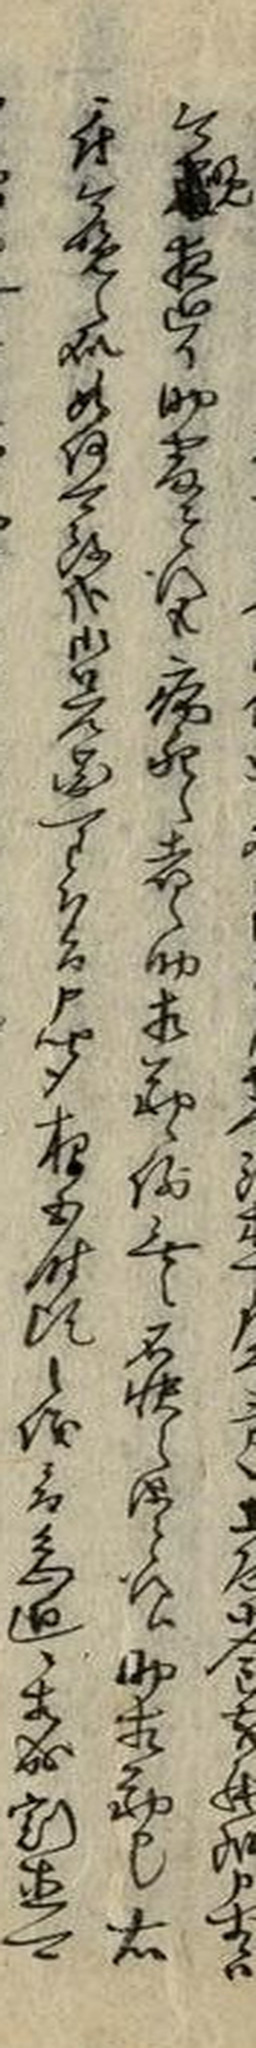に付今晩之処如何可致哉御差図可被下旨申聞夜五時頃之儀にて急迫に相成割直可
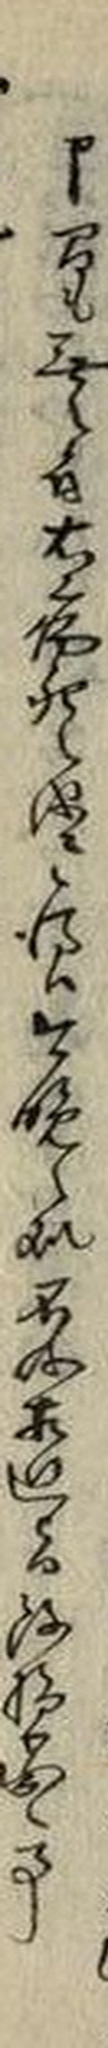申間も無之に付右病死之儀に候得は今晩之処不及相廻旨致指図候事
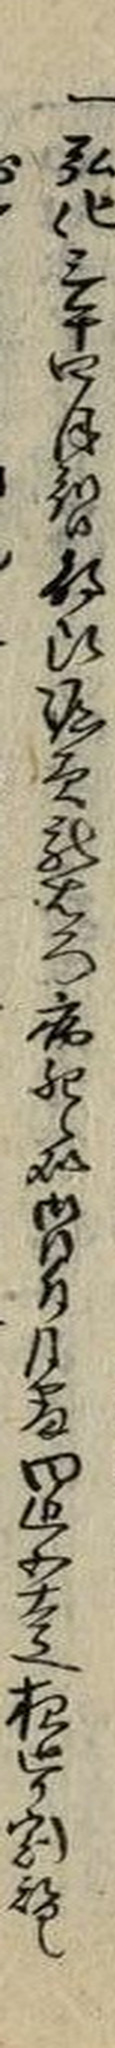一弘化三午四月朔日触頭渥美新右衛門病死之処御目付月番田辺五大夫夜廻り割替之
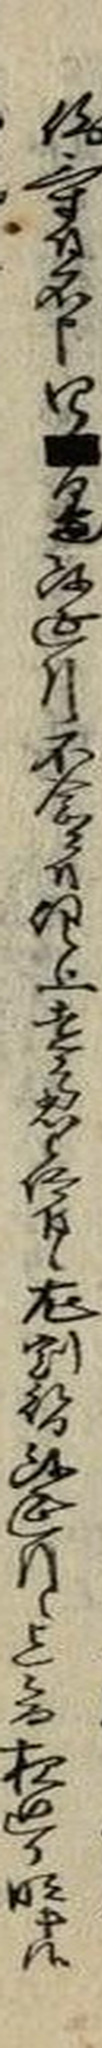儀気付不申四日迄致延引不念に付伺之上遠慮被仰付候尤割替致延引候迄にて夜廻り明申候
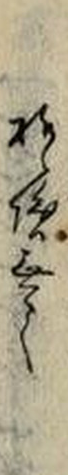様之儀は無之
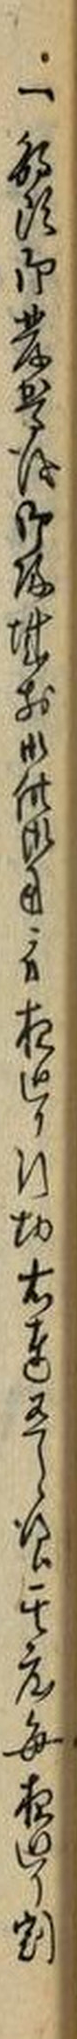一触頭御発駕後御帰城前御供御用に付夜廻り引切右達有之候得は其度毎夜廻り割
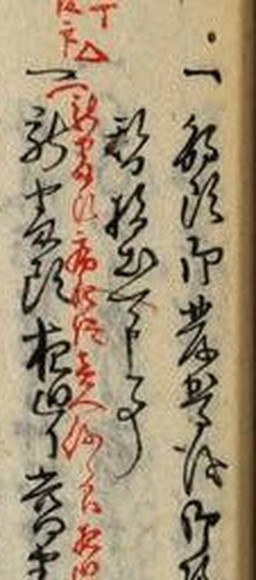替指出可申事
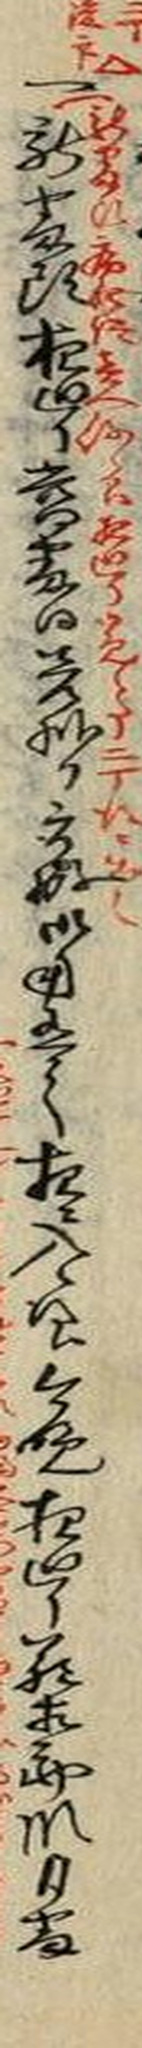一新番頭夜廻り当番日差掛り取扱御用有之夜に入候得は今晩夜廻り難相勤段月番
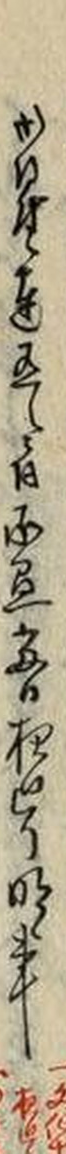御目付へ達有之に付承置当日夜廻り明候事
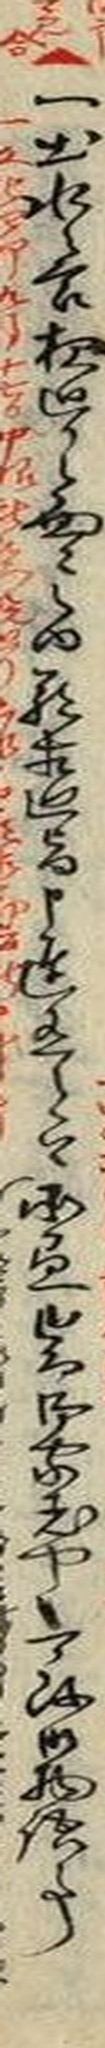一出水之節夜廻り之面々之内難相廻旨申達有之候はゝ承置候て御家老中へ可致御物語事
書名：御城下諸事之部
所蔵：福井県文書館 Fukui Prefectural Archives
